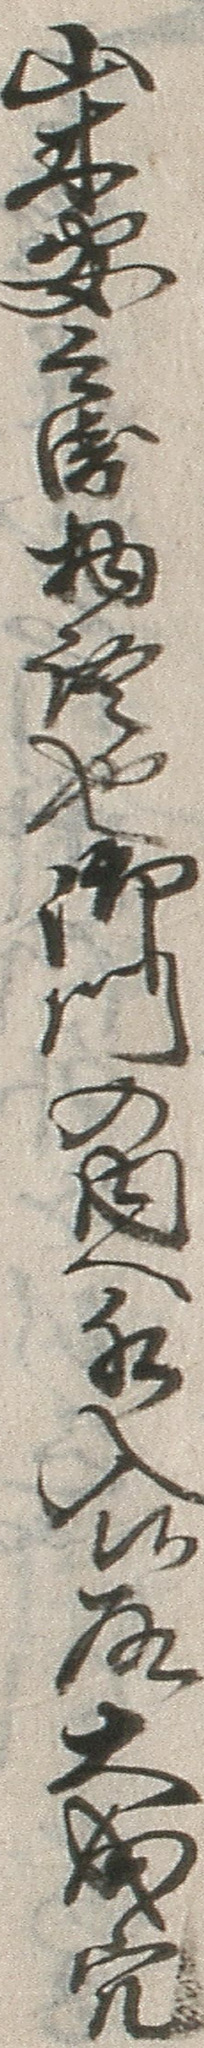山木安兵衛物語也御門の内へ水入候故大成穴
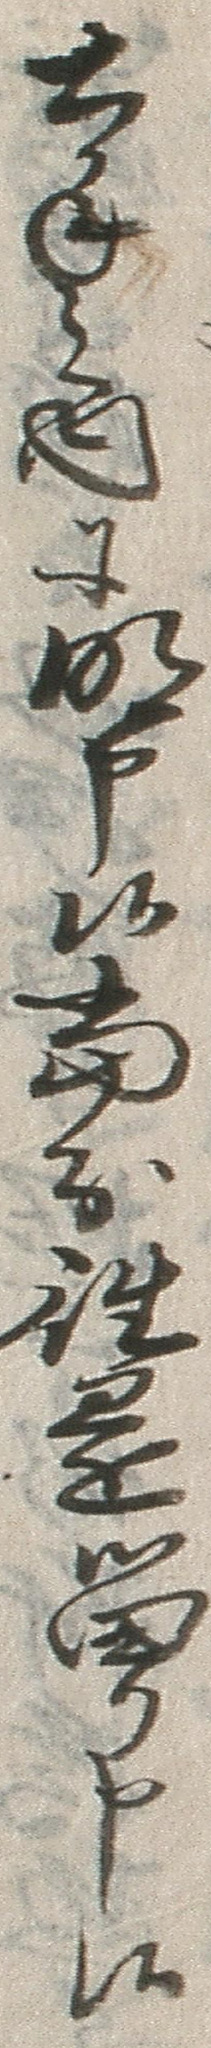土手之内に明申候当分往還留り申候
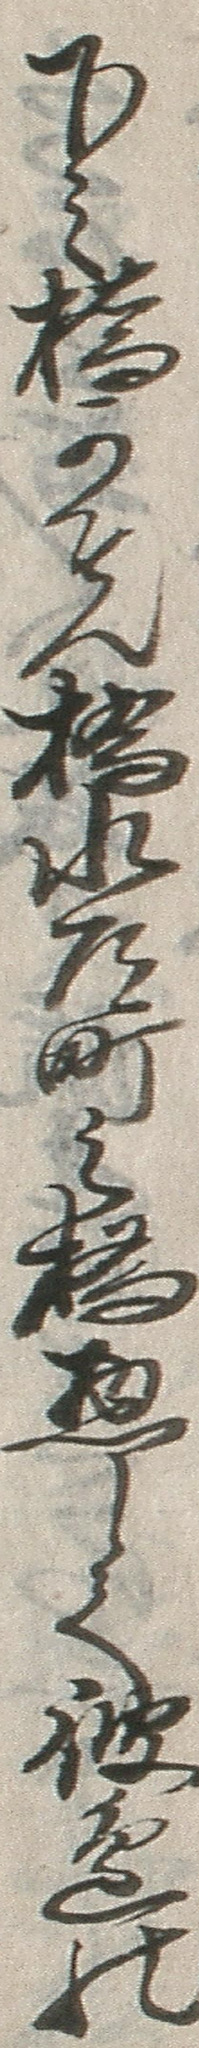下之橋かもん橋水道町之橋惣して彼辺の
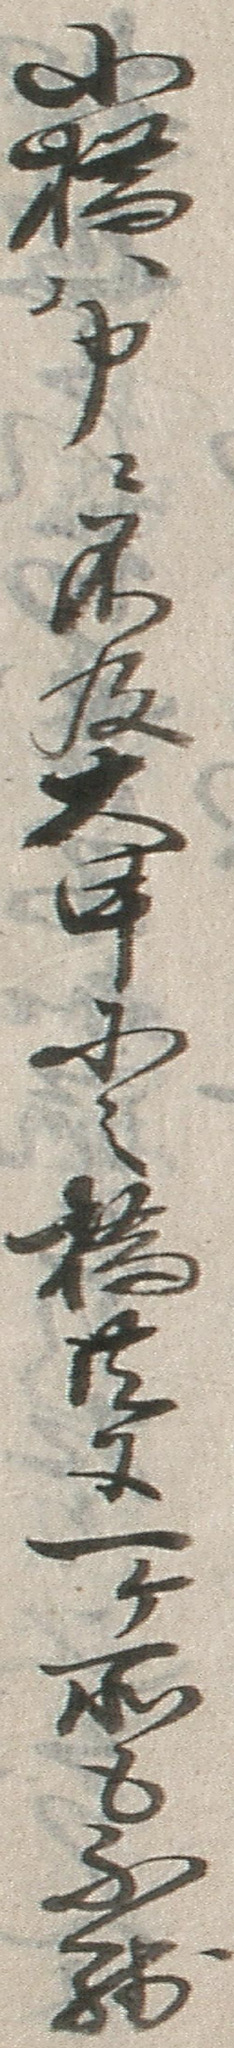小橋は申に不及大中小之橋共に一ヶ所も不残

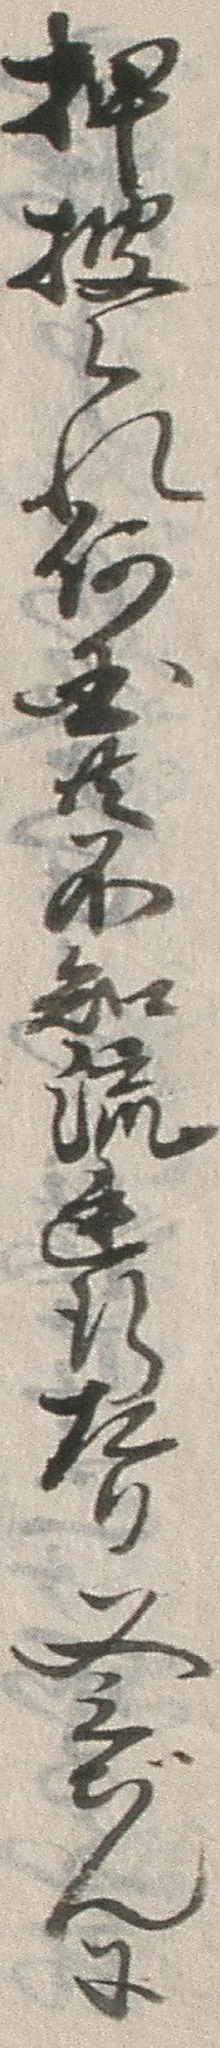押披かれ何国共不知流れ行たり又みぢんに
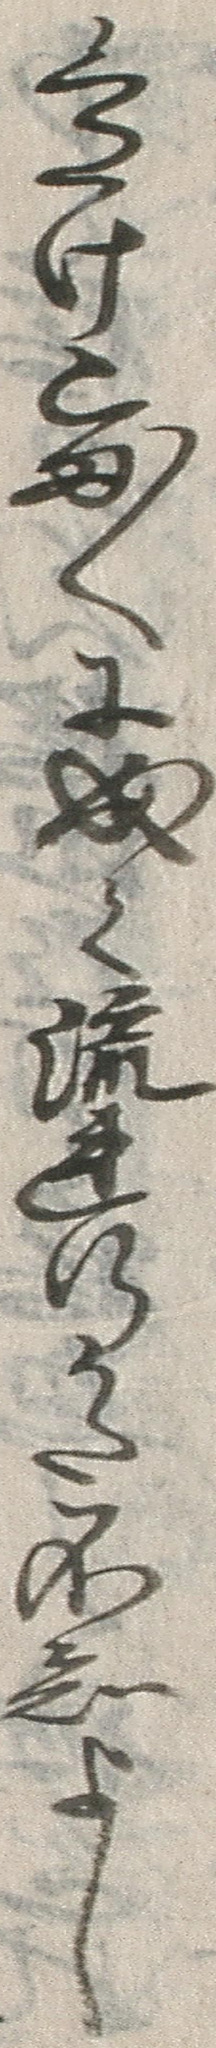くたけこま〳〵に成て流れ行かた不知よし
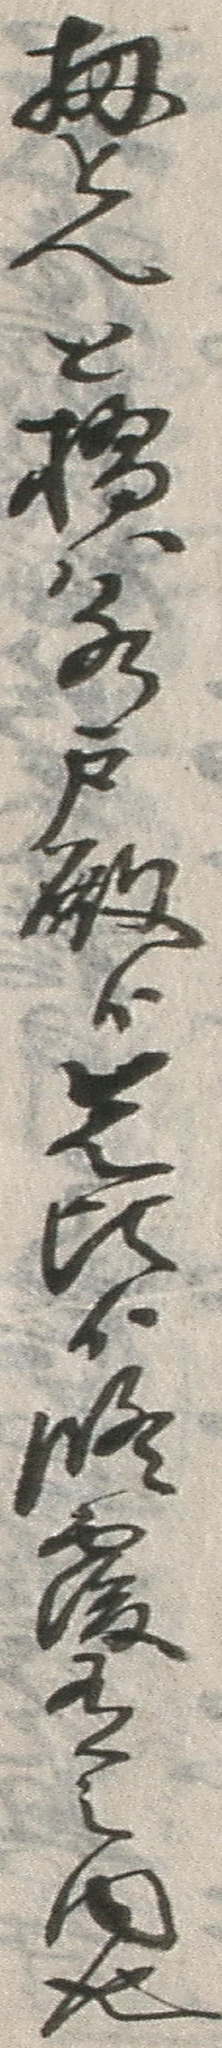扨とんと橋は水戸殿ゟ先頃ゟ修覆有之内也
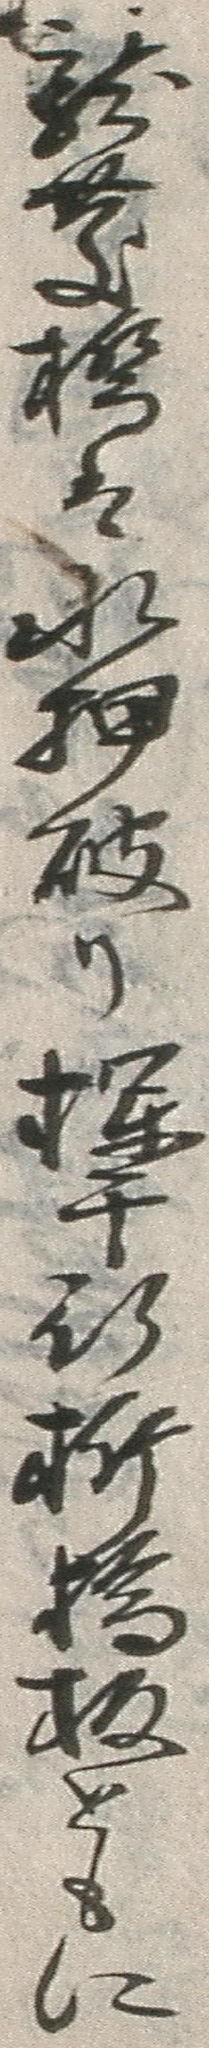龍慶橋は水押破り欄干行桁橋板ともに
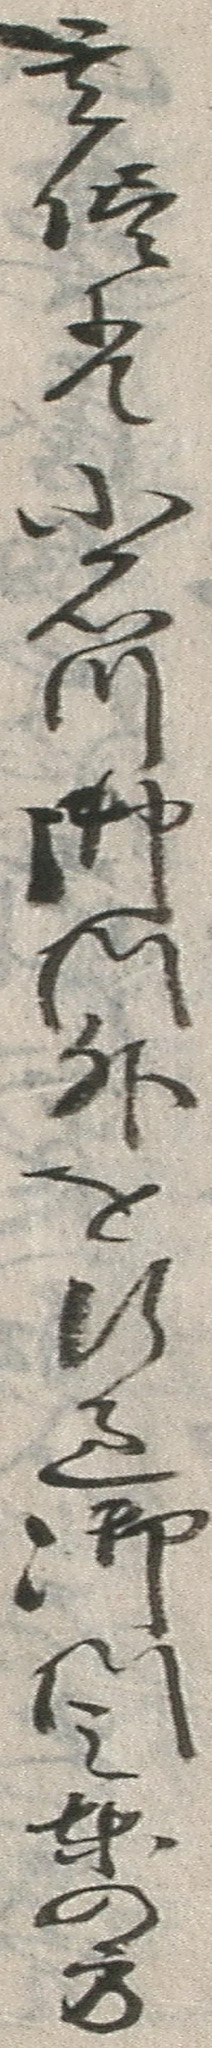其儘にて小石川御門外を行過御門之東の方
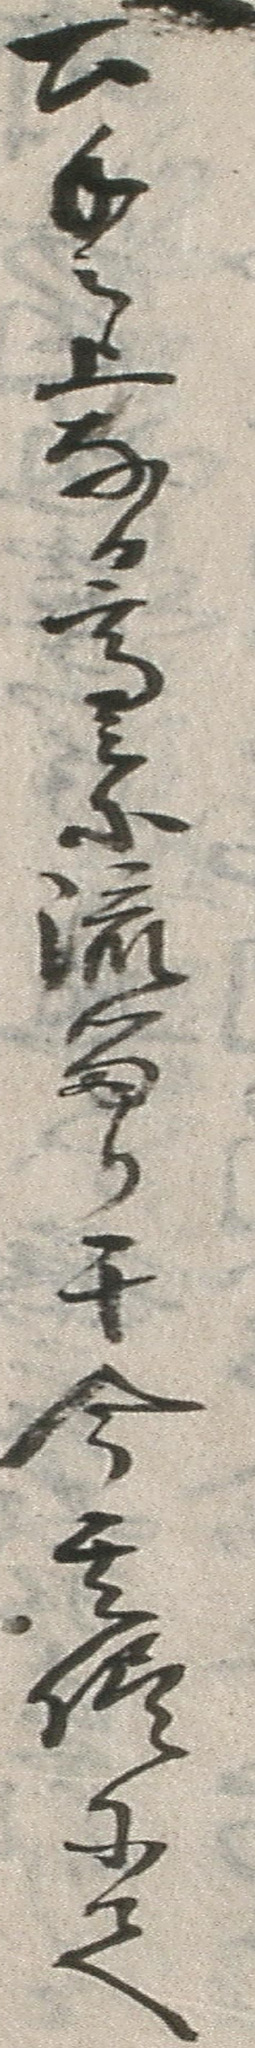土手之上なる高みに流留り于今其儘にて
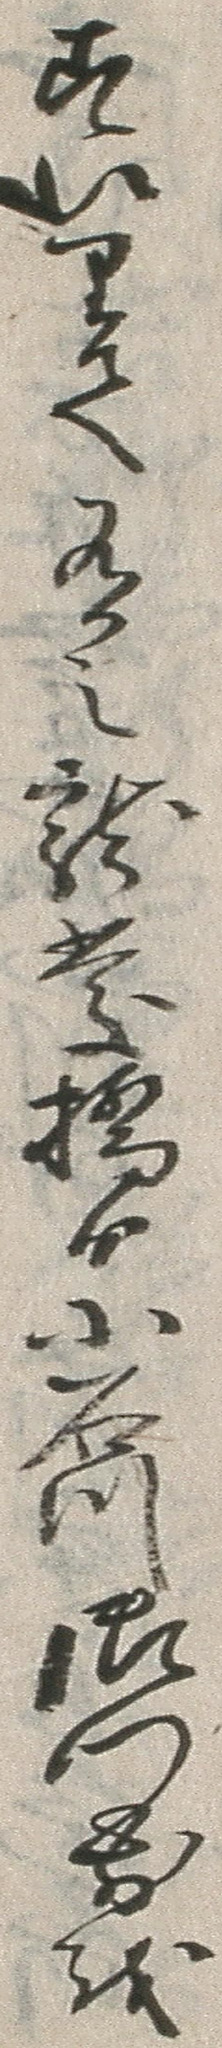すいりて有之龍慶橋ゟ小石川御門前を
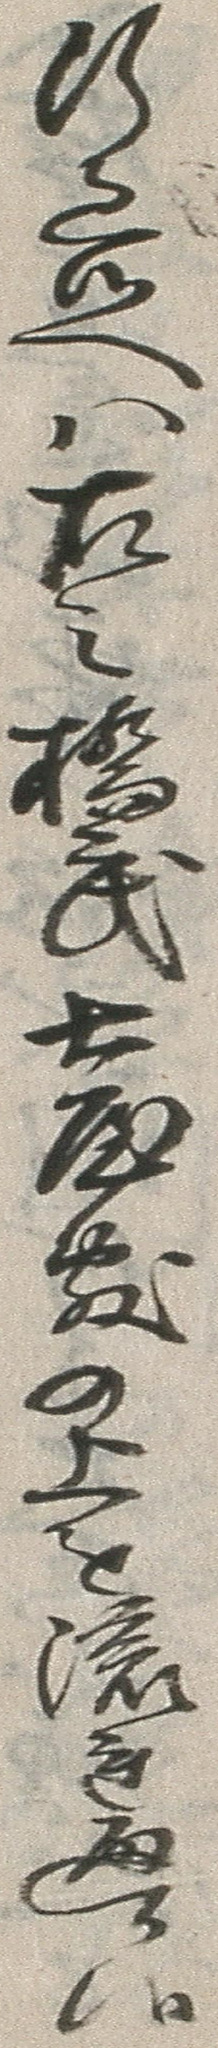行過候へは右之橋武士屋敷の上を流れ通り候
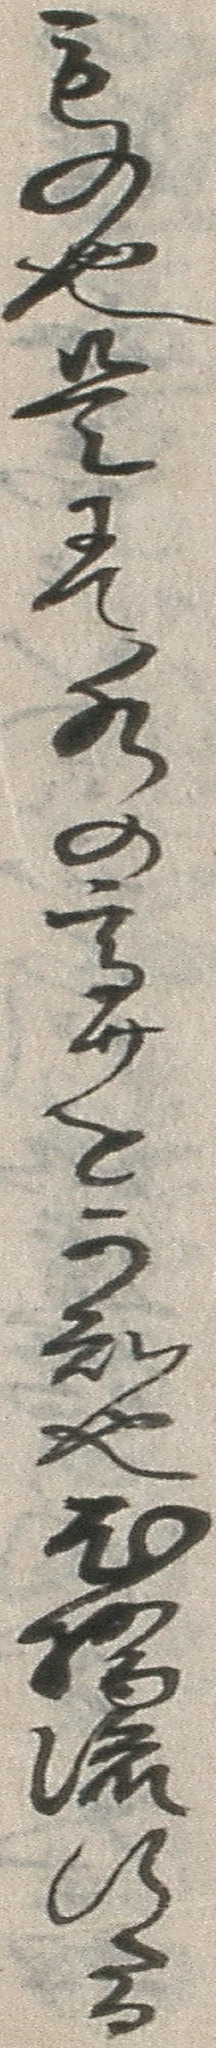もの也是にて水の高サを可知也尤橋流行たる
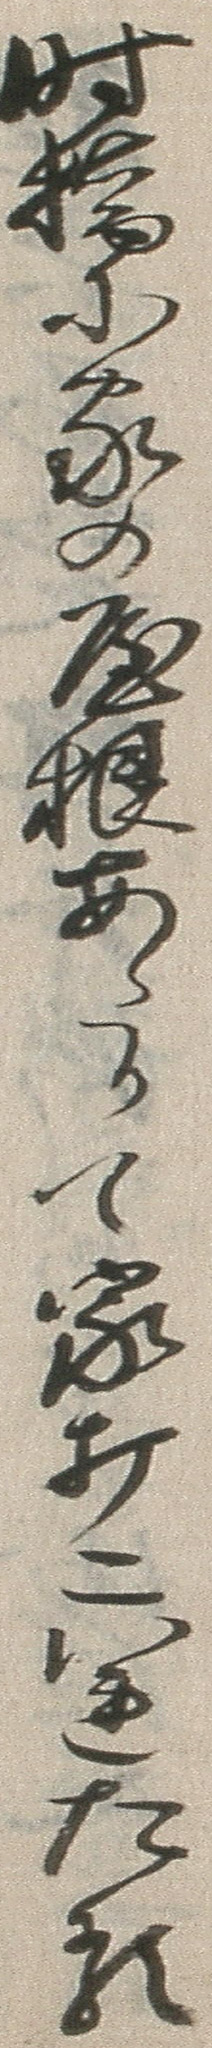時橋に家の屋根あたりて家打こはれたる
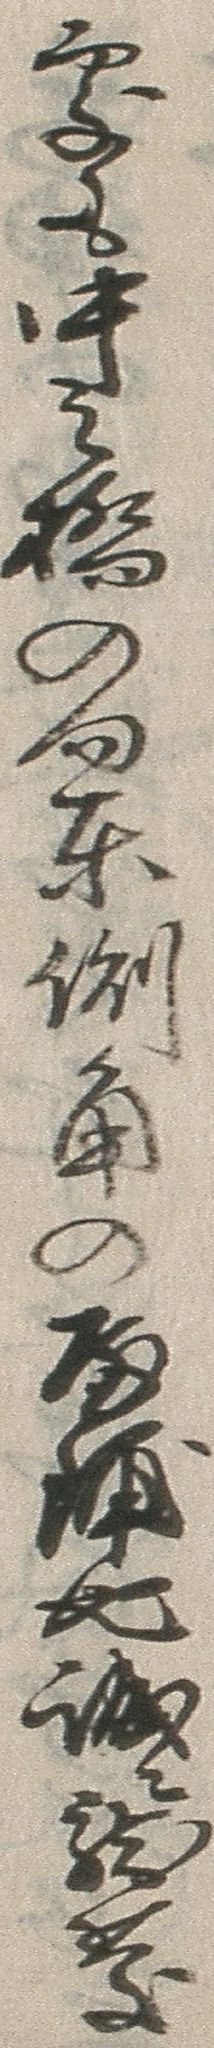処も中之橋の向東側角の屋敷也誠に龍慶
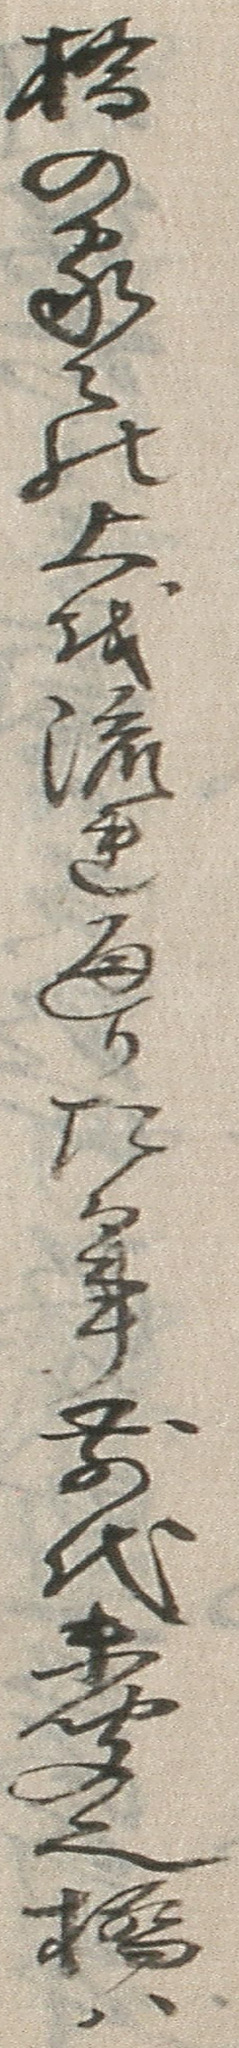橋の家々の上を流れ通りたる事前代未聞也橋は
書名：享保十三年江戸洪水記
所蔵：東京大学地震研究所図書室 Earthquake Research Institute Library, The University of Tokyo, JAPAN
